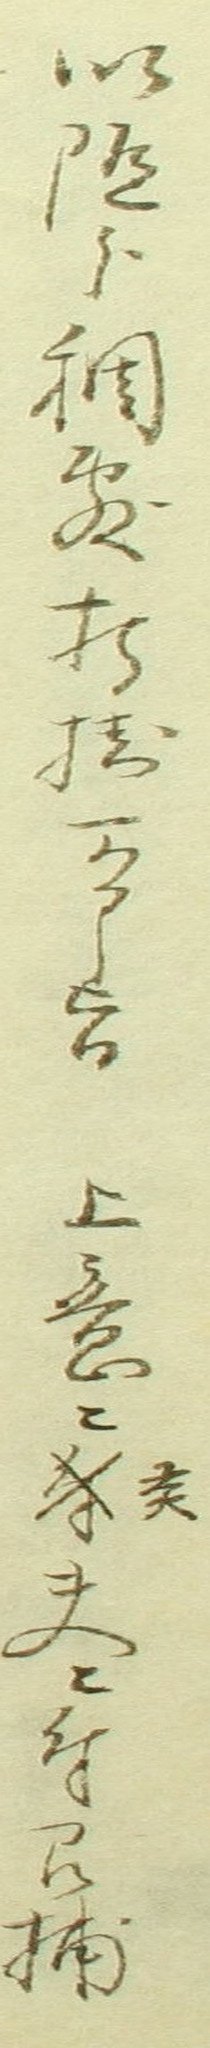以随と稠敷打掛可申旨上意に？？夫に付召捕
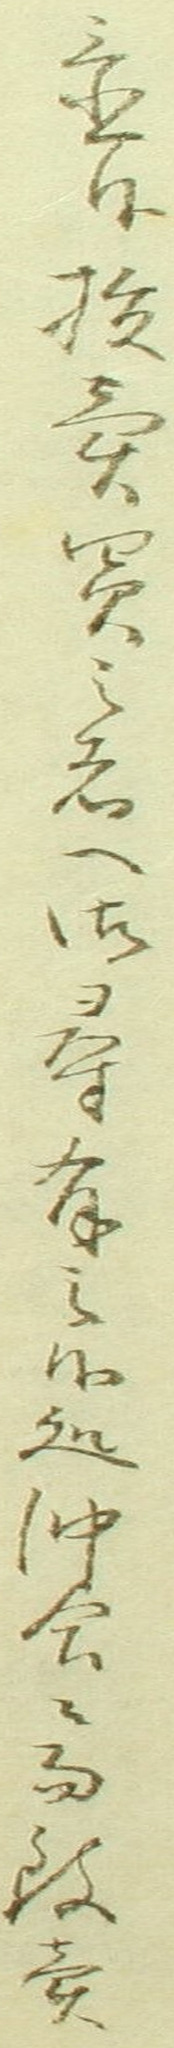置候？売買之者へ御尋有之候処仲会に而致売
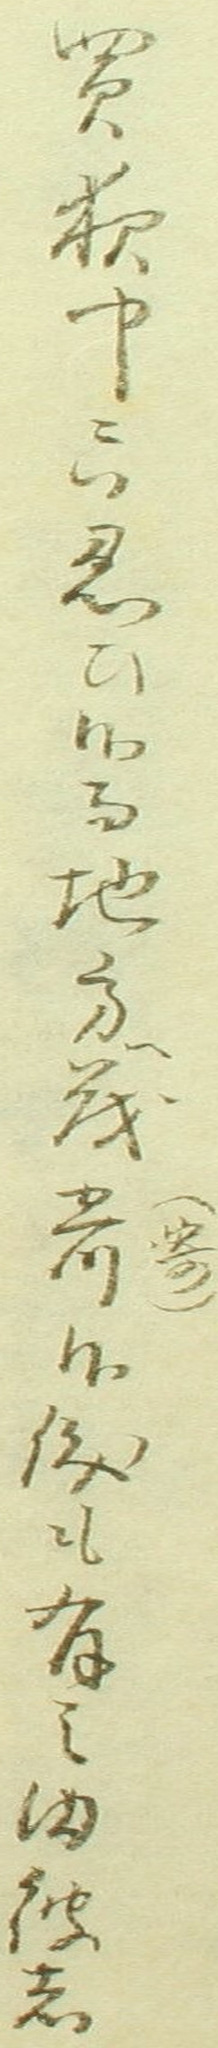買夜中には忍ひ候而地方へも寄候儀も有之内彼者
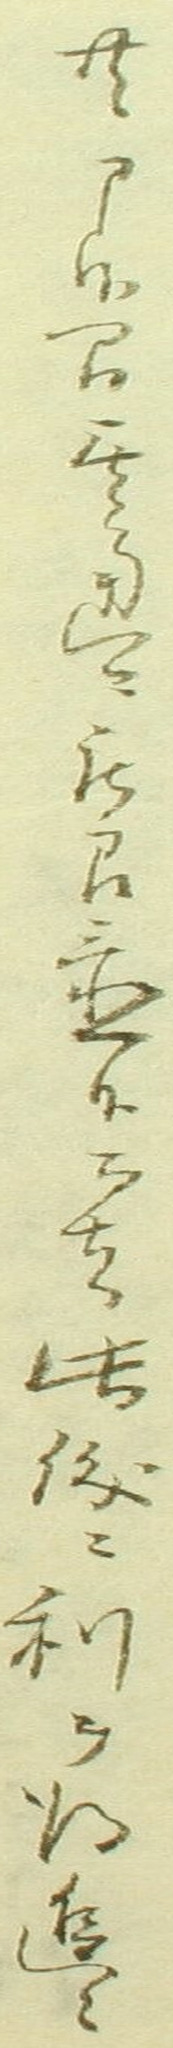共申候間其通に罷召置候而者此儀に利を得追々
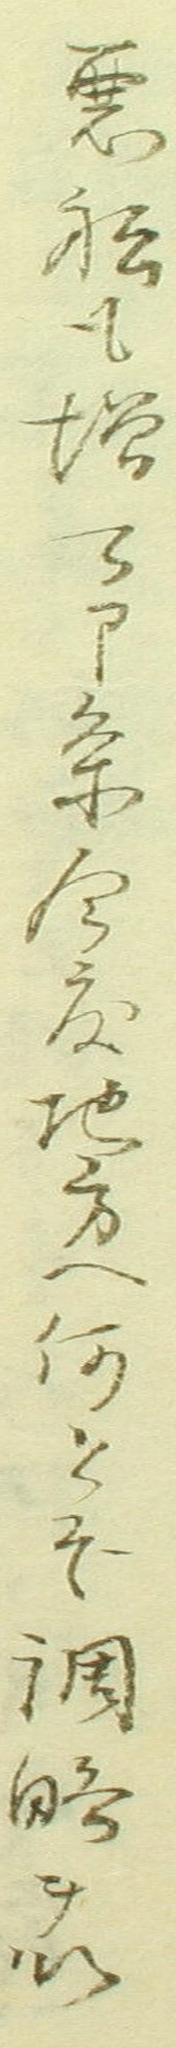悪船も増可申条今度地方へ何とぞ調？を以
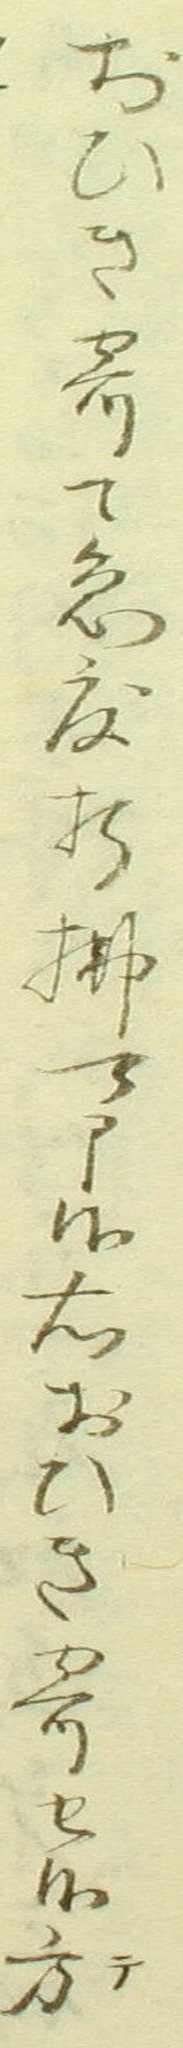おひき寄て急度打払可申候右おひき寄せ候方
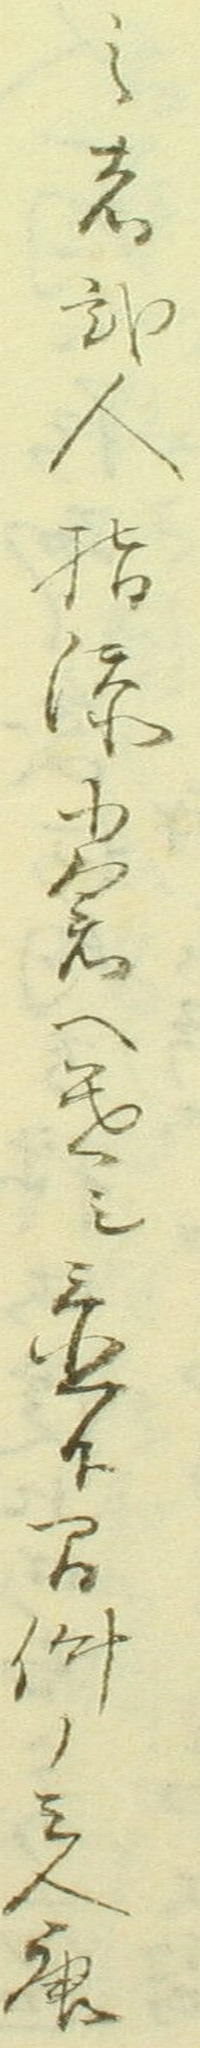之者弐人指添小倉へ遣し置候間件三人唐
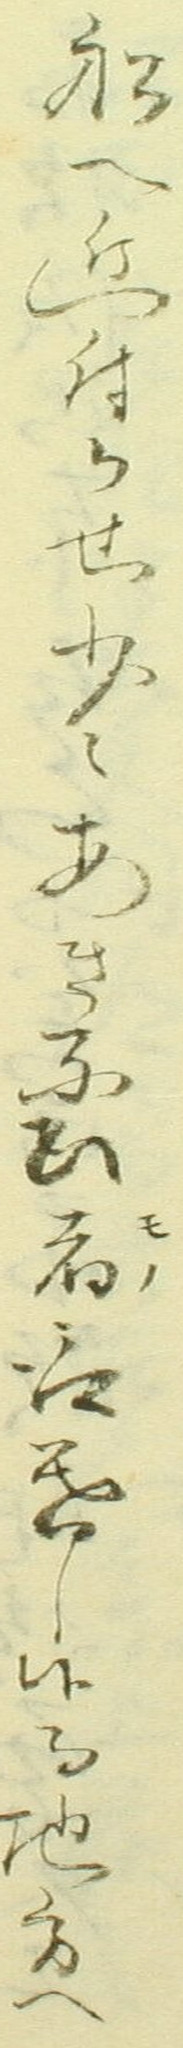船へ近付かせ少々あきなひ者取暮し候而地方へ
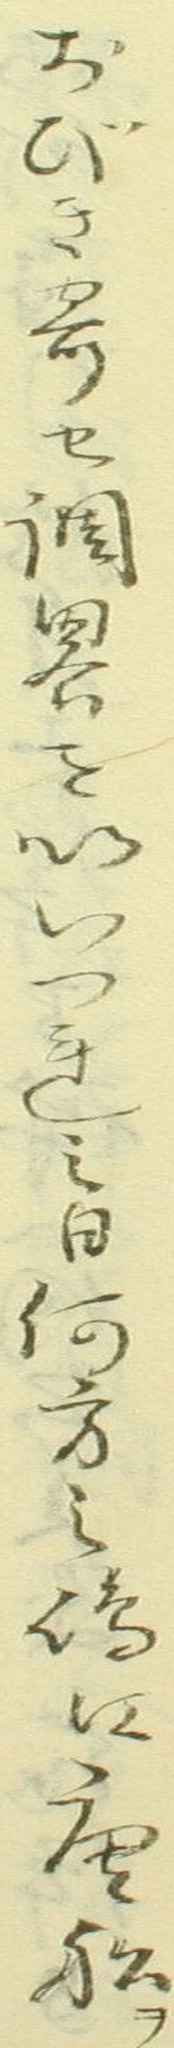おびき寄せ調略を以いつれ之日何方之嶋江唐船を
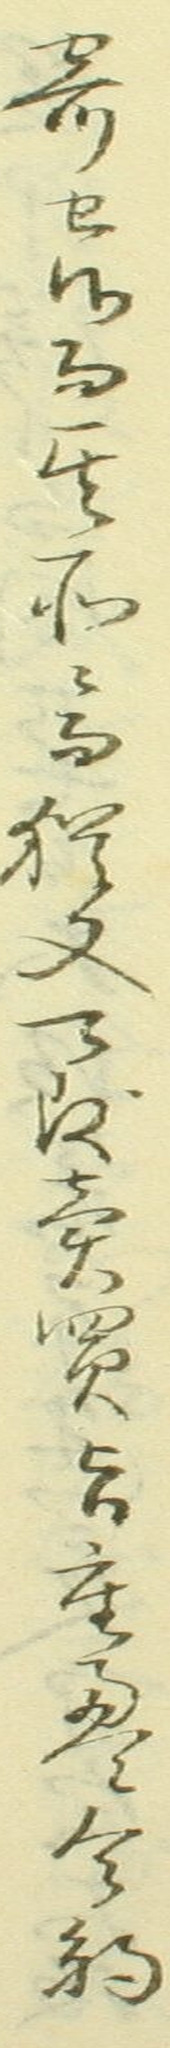寄せ候而其所に而猶又可致売買旨座畳今約
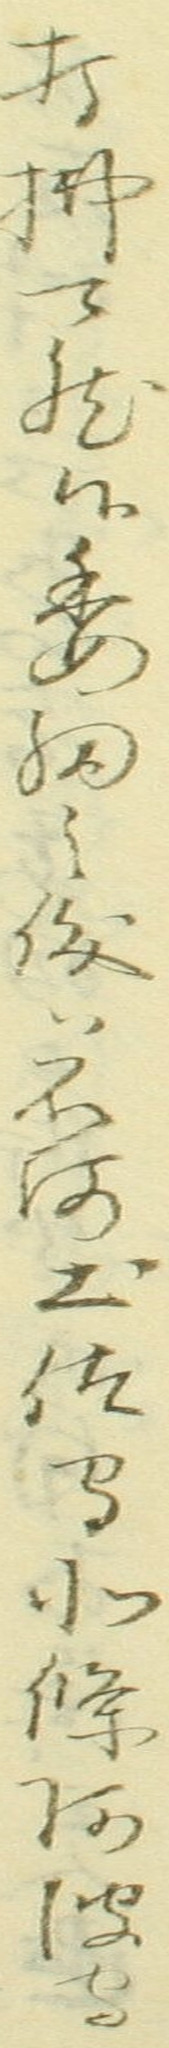打払可然候委細之儀は不阿土佐守北条阿波守
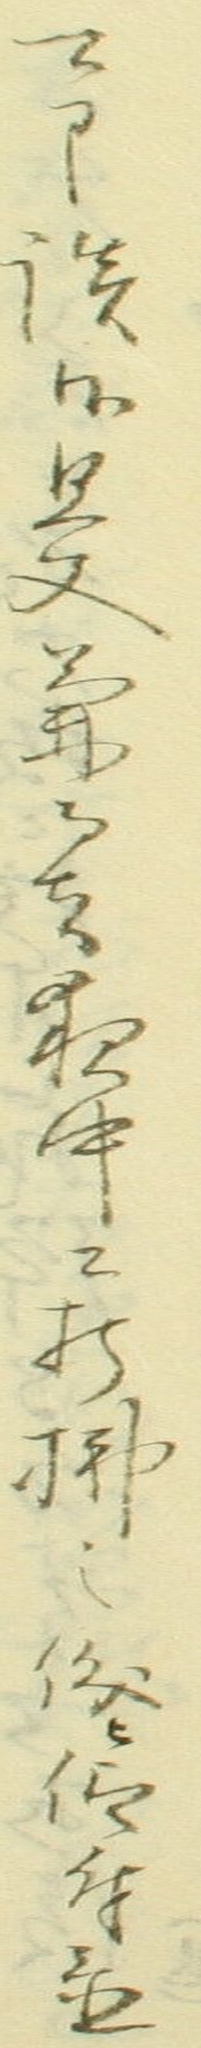可申談候是又兼而者夜中に打払之儀に仰付置
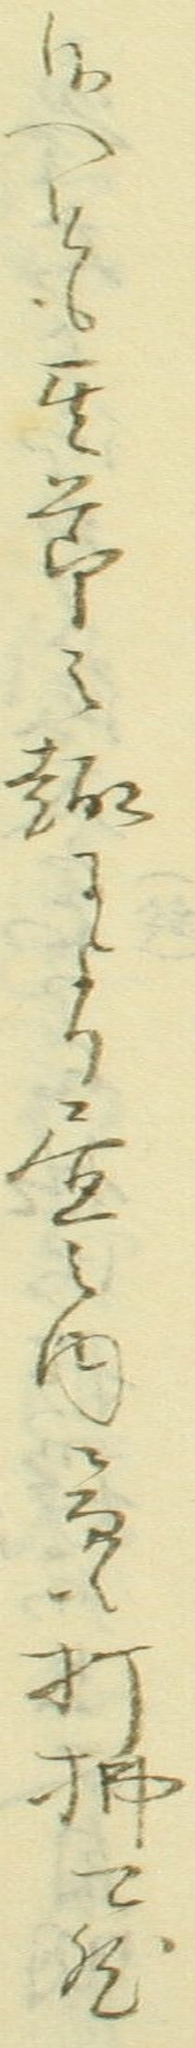候へとも其節之趣により昼之内に而候打払可然
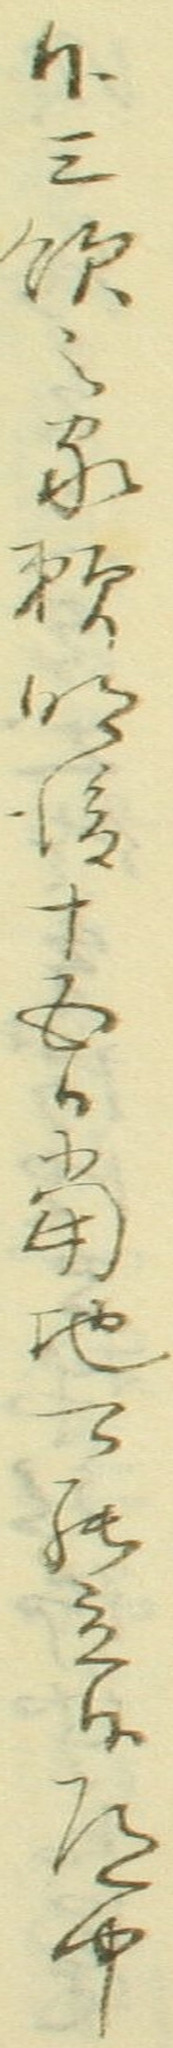候三領之家頼明後十五日当地可罷立候道中
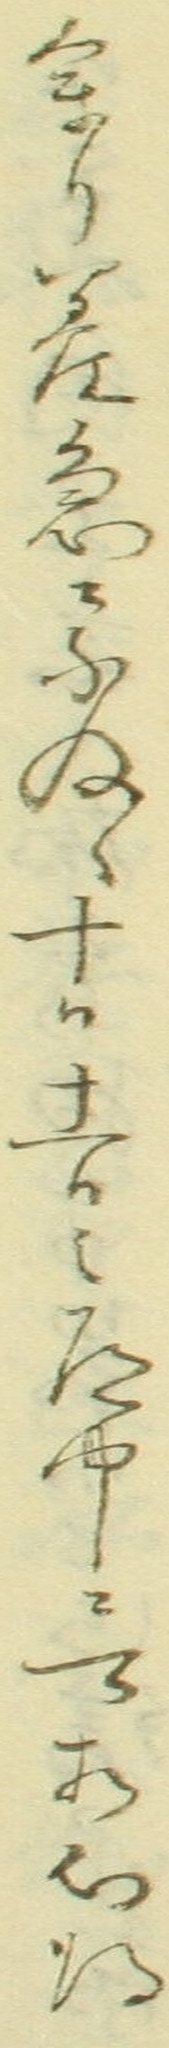余り差急に不為候十日十一日之道中に可相心得

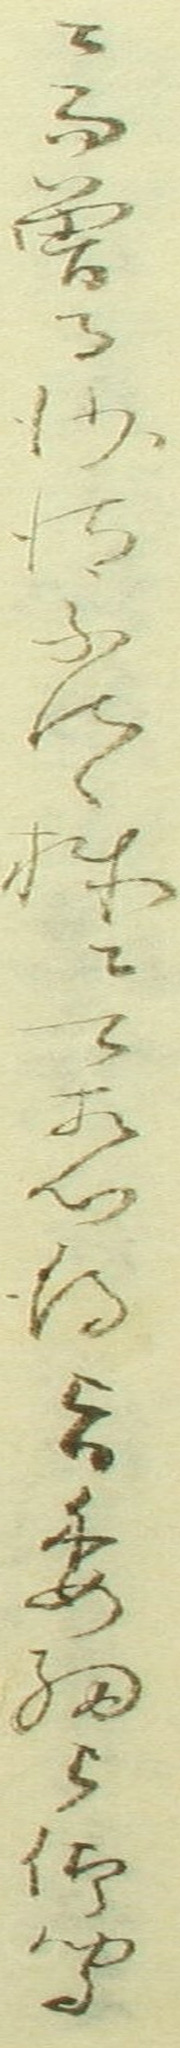に而曽る沙汰不仕候様にて相心得旨委細被仰聞
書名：唐船漂流記 四
